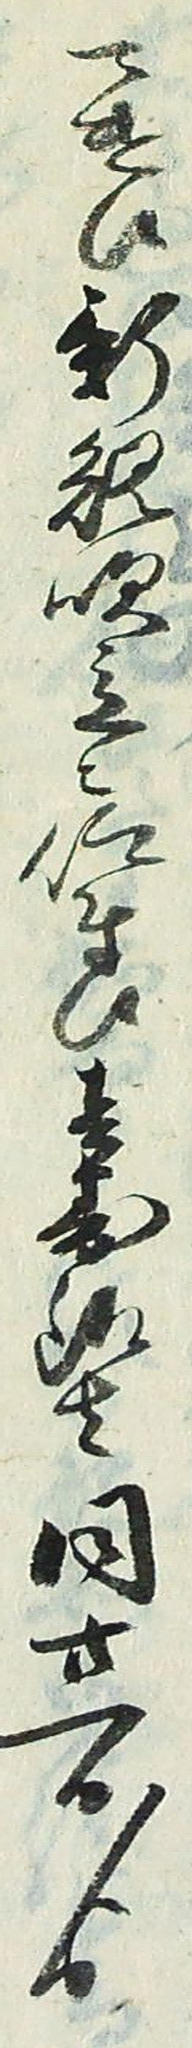可遣候新規吹立被仰付候壱歩銀は同廿一日ゟ
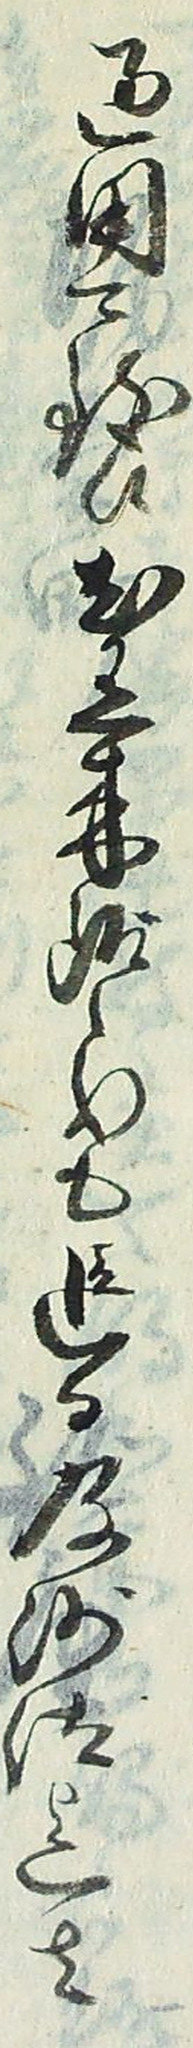通用可致候尤有来銀之義も追々及沙汰迄は
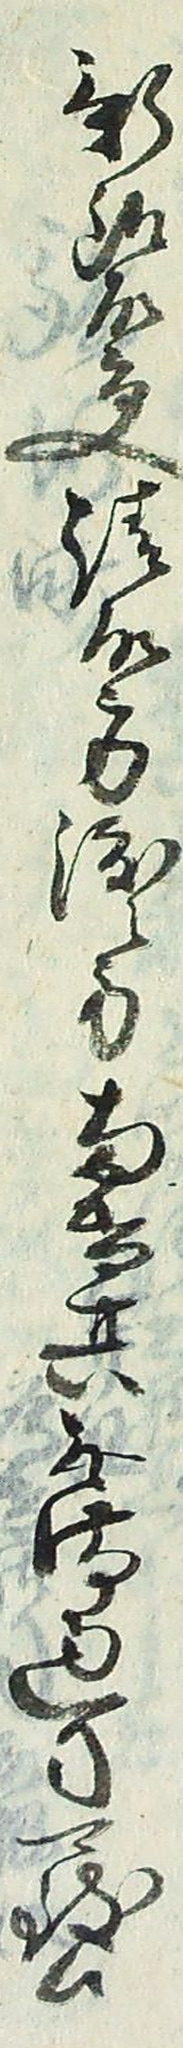新銀取交請取方渡し方両替共無滞通用可致候
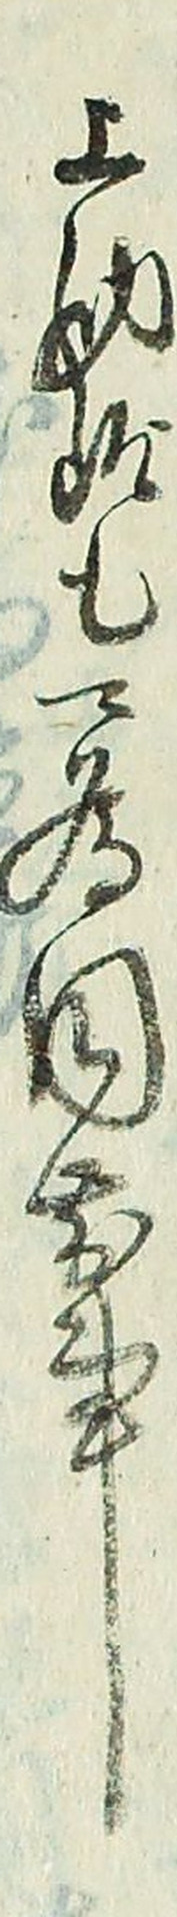上納銀も可為同前事
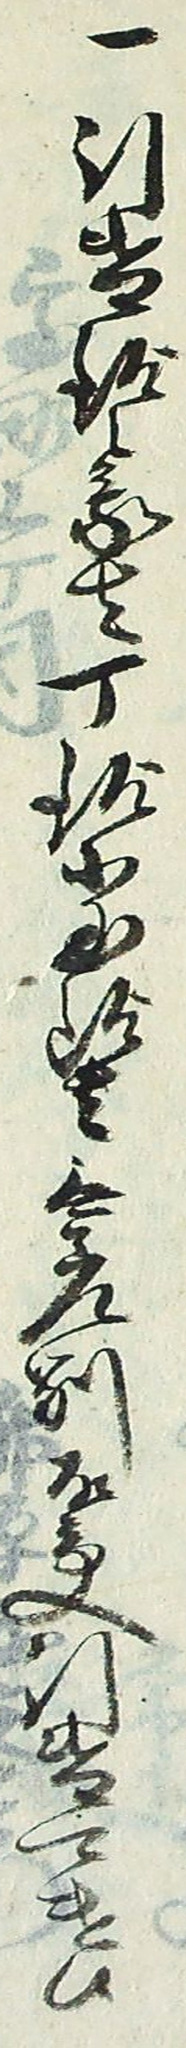一引替銀之義は丁銀小玉銀は無差別取交引替可遣候
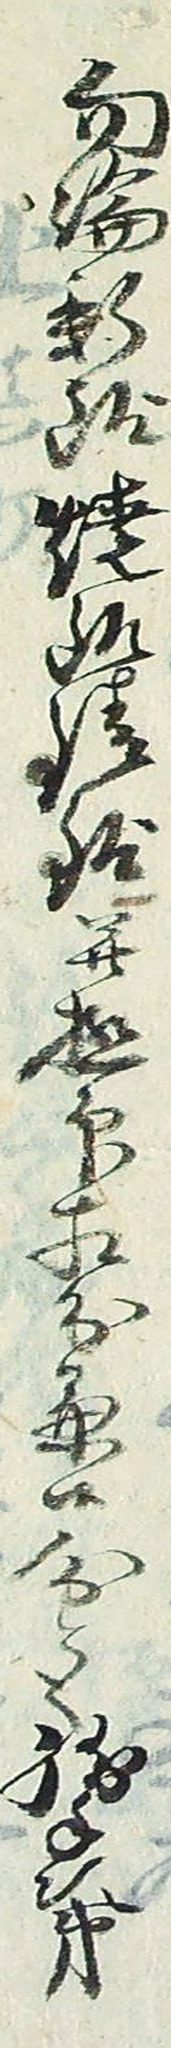勿論新銀焼銀錆銀幷極印相分兼候分とも勝手次第
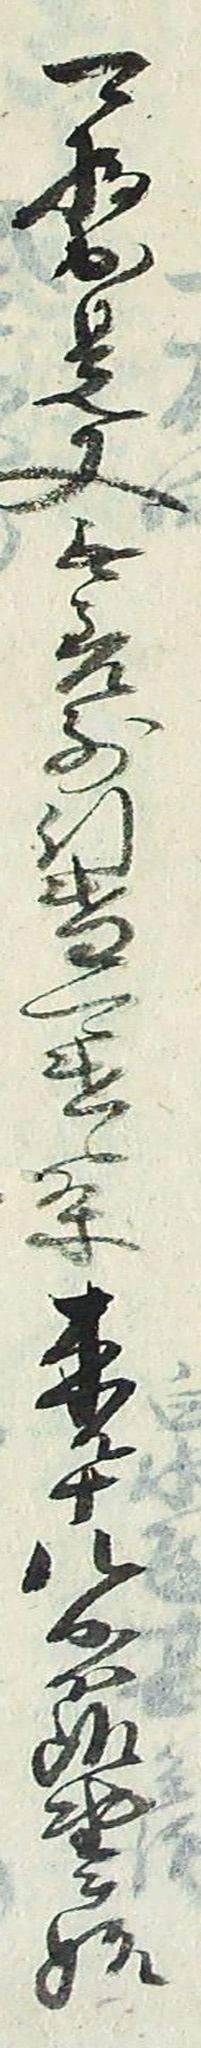可指出是又無差別引替可遣候条来る十八日ゟ銀坐を始
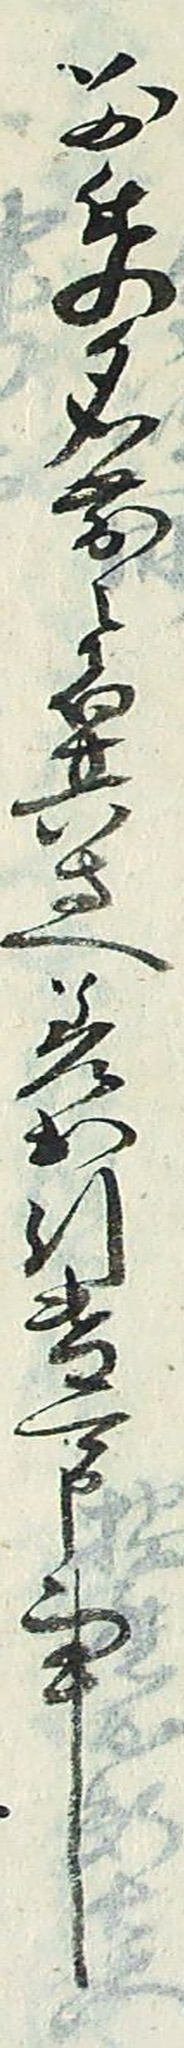別帋名前之者共方へ差出引替可申事
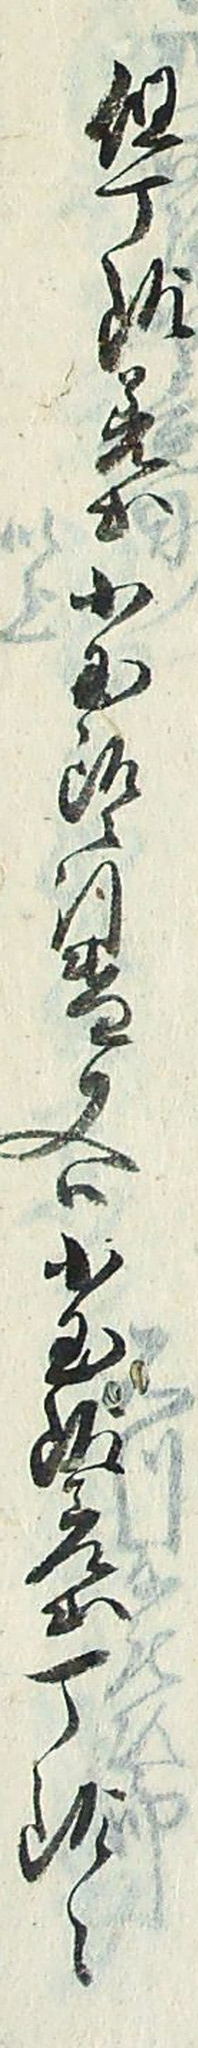但丁銀差出小玉銀に引替又は小玉銀差出丁銀に

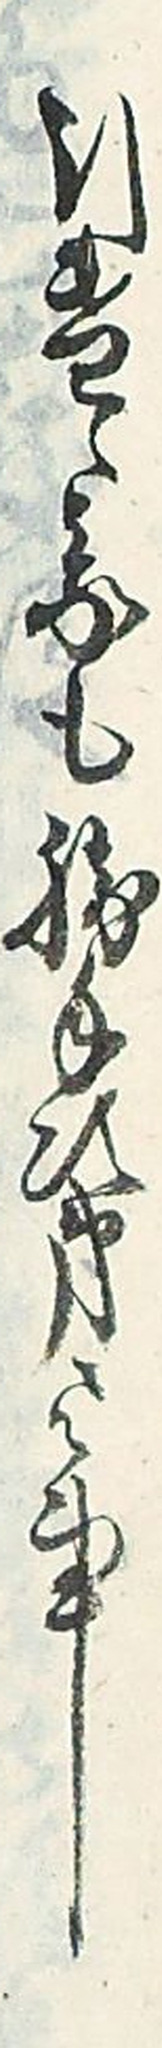引替候義も勝手次第に候事
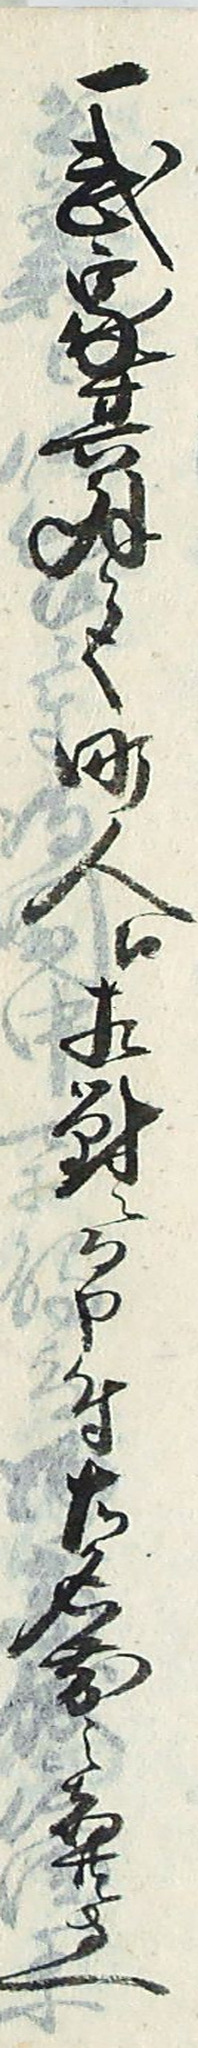一武家其外とも町人江相対に而申付右名前之者
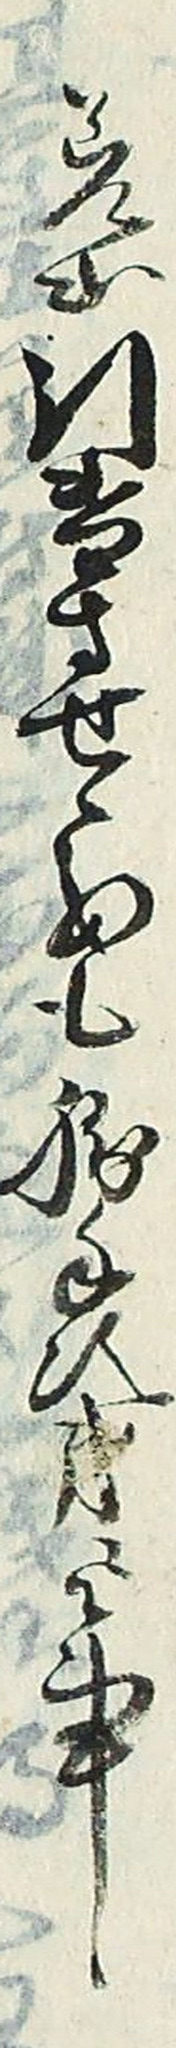差出引替させ候義も勝手次第に候事
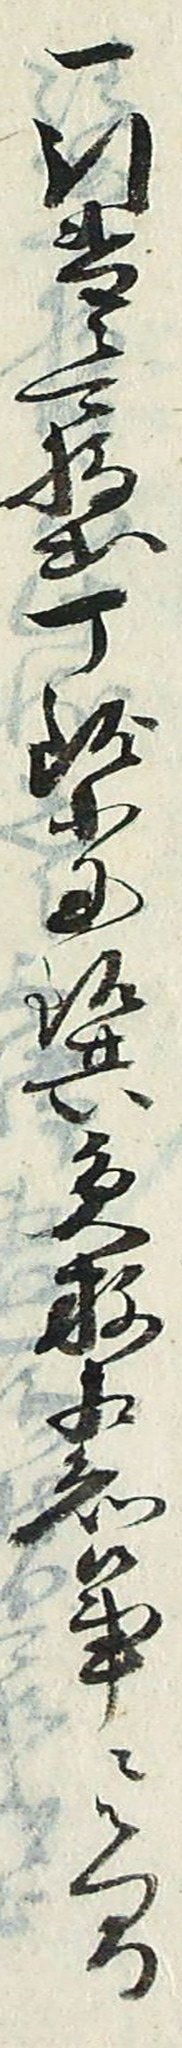一引替に可指出丁銀小玉銀共員数相知候事に候間
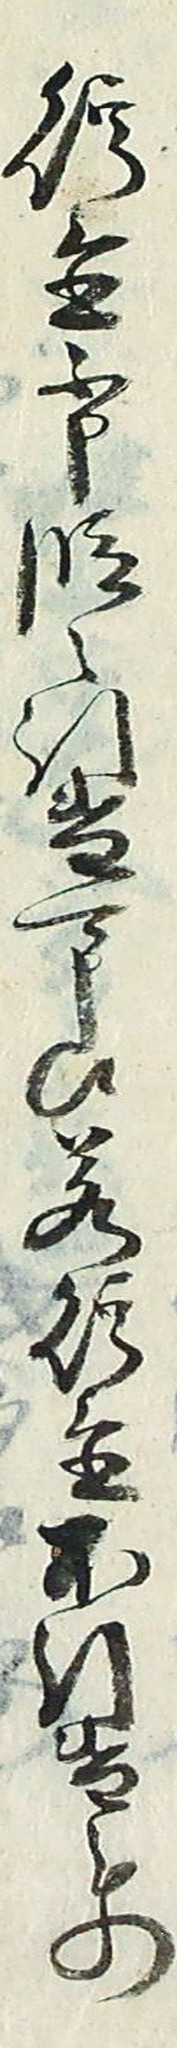貯置不申段々引替可申候若貯置不引替もの
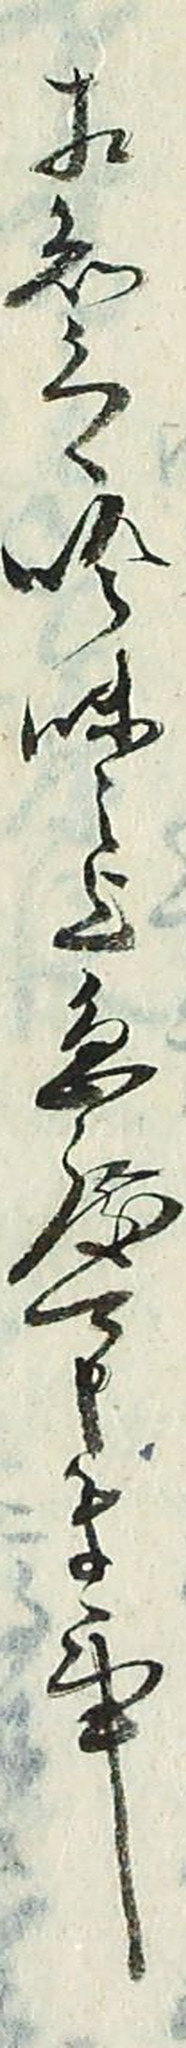相知候はゝ吟味之上急度可申付事
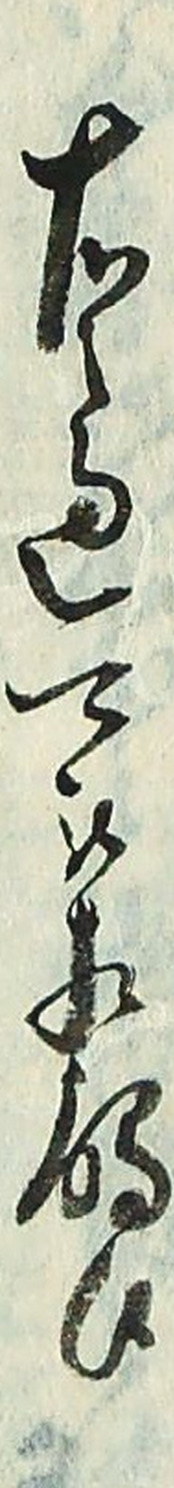右之通可被相触候
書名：諸御用御□受書控
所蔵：鳴門教育大学 Naruto University of Education
